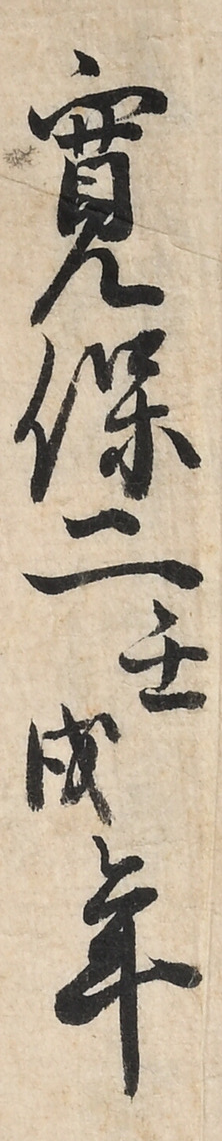寛保二壬戌年
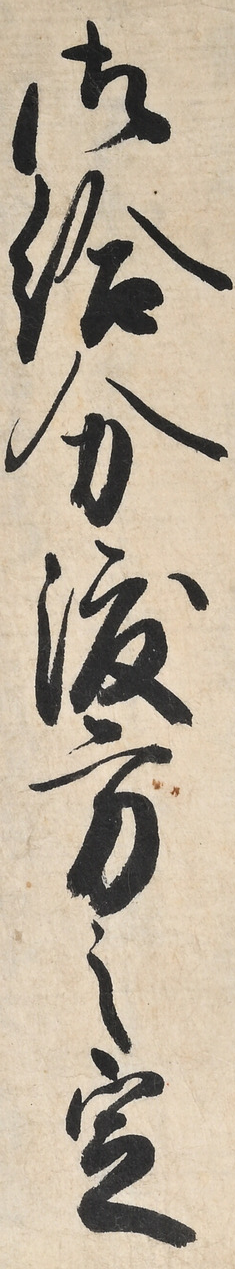御給分渡方之定

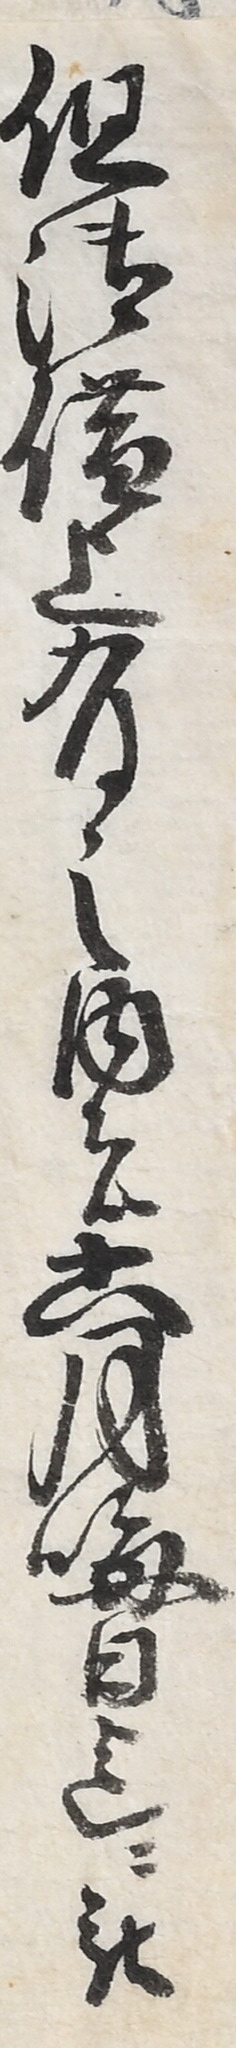但御借上有之内は六月晦日迄ニ被
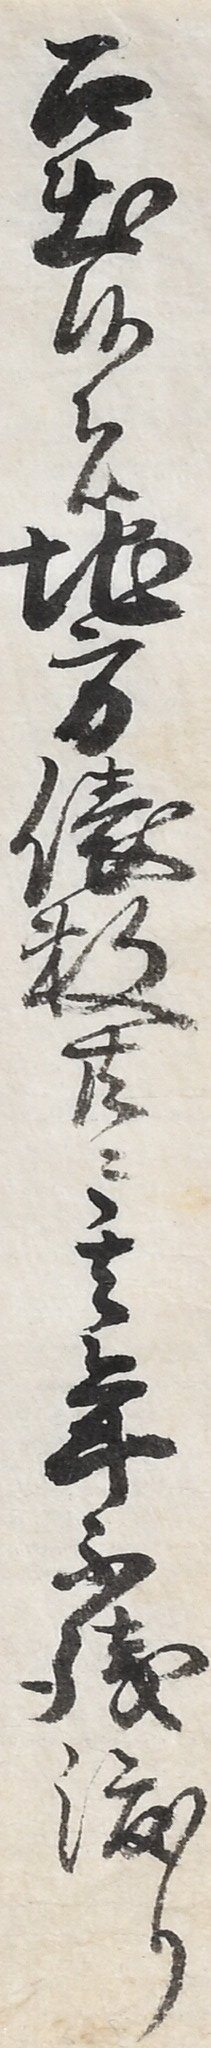召出候は地方俵数共其年不残渡り
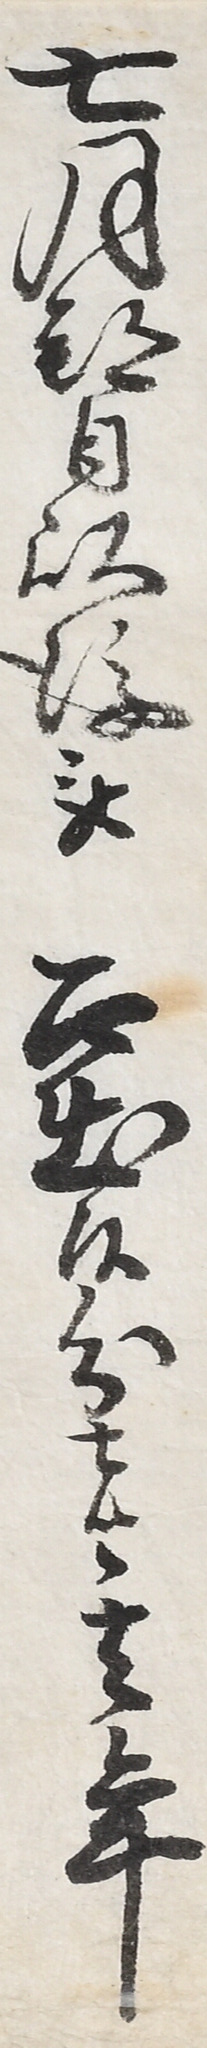七月朔日以後被召出候分は其年
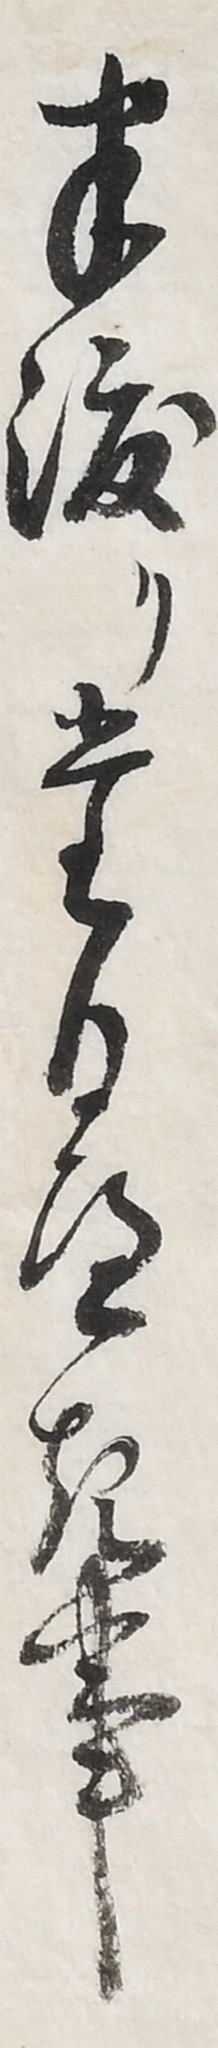半渡りたるへき事
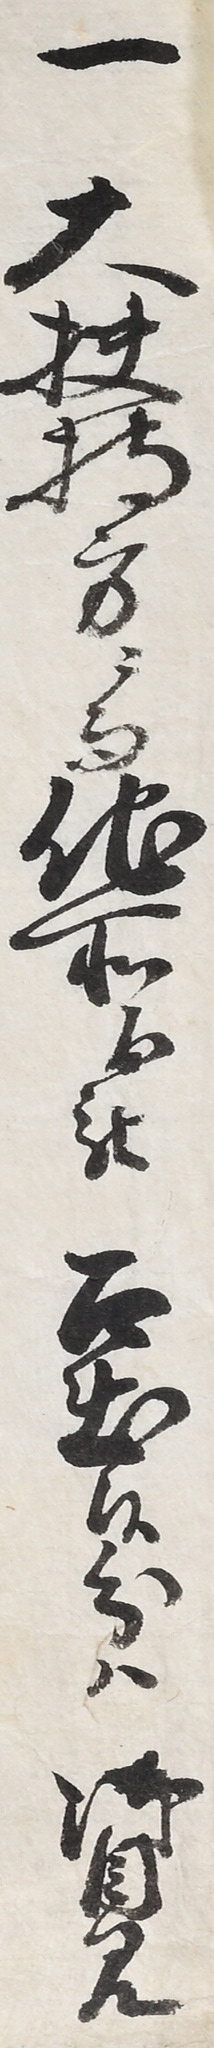一大扶持方ニ而他所ゟ被召出候分ハ御目見
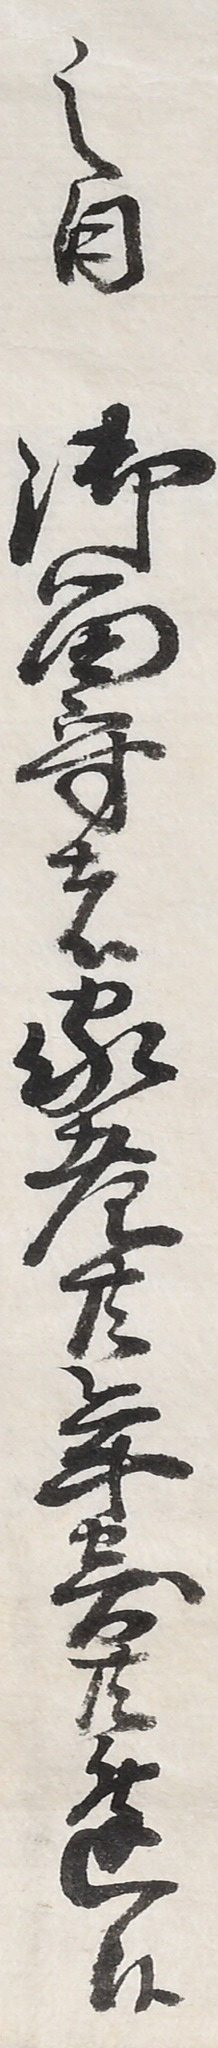之日御留守は家老共年寄共逢候
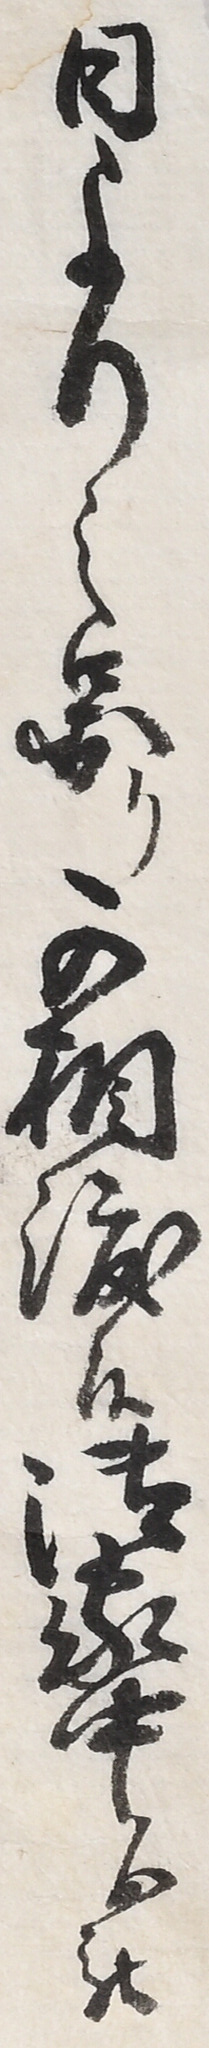日より之図り可相渡候御家中ゟ被
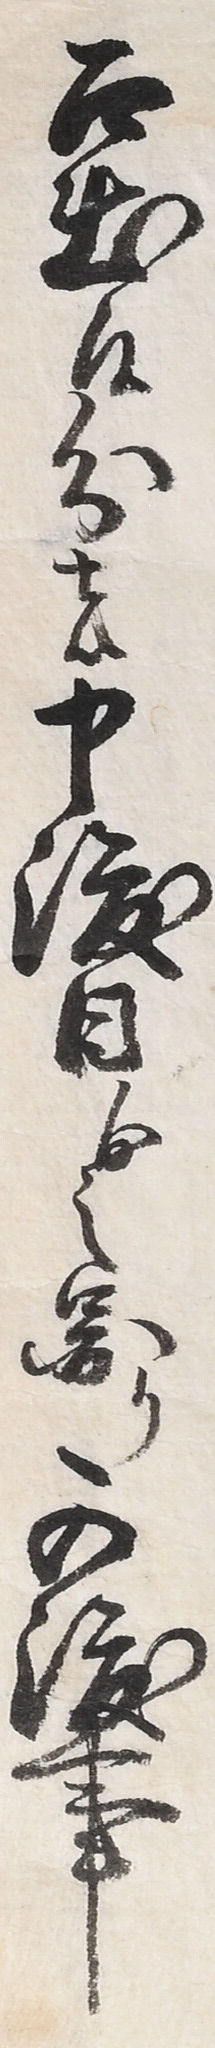召出候分は申渡ゟ之図り可渡事
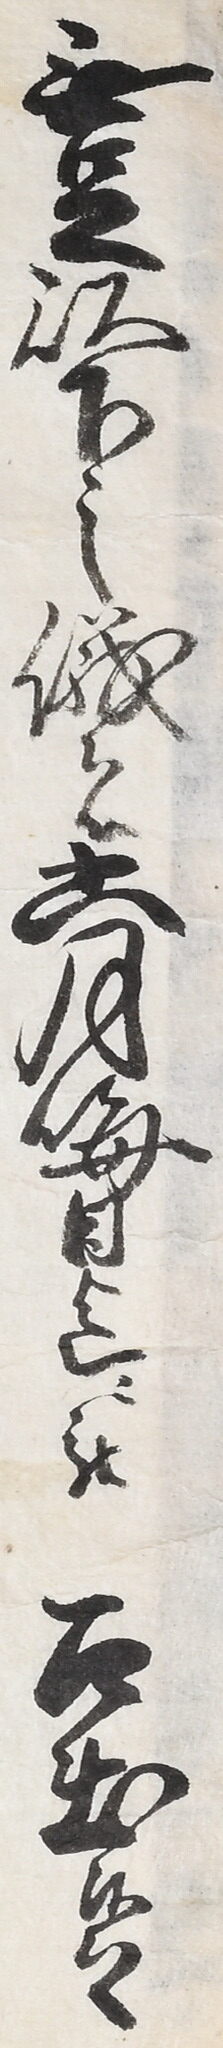無足以下之儀は六月晦日迄ニ被召出候ハヽ
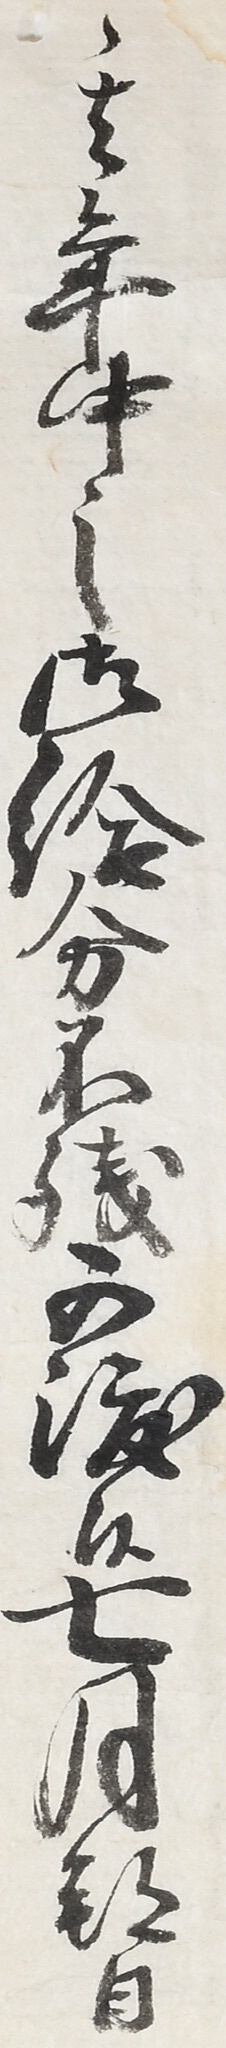其年中之御給分不残可渡候七月朔日
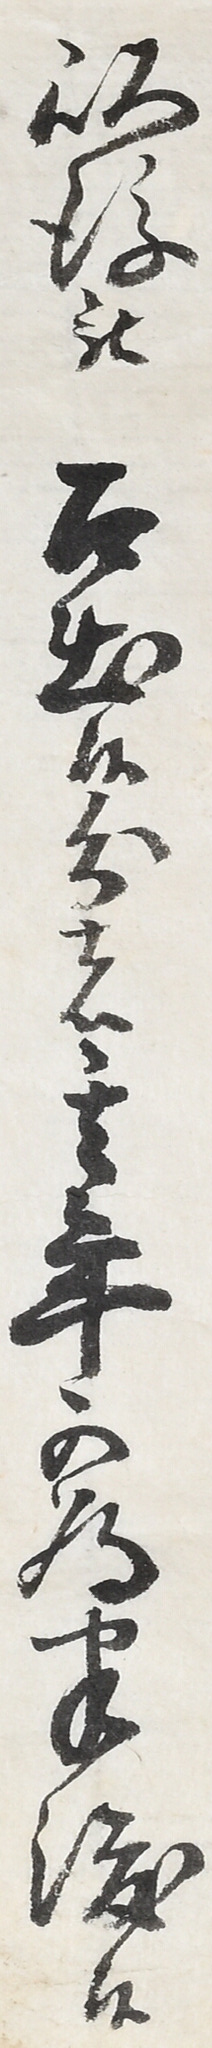以後被召出候分は其年可為半渡候
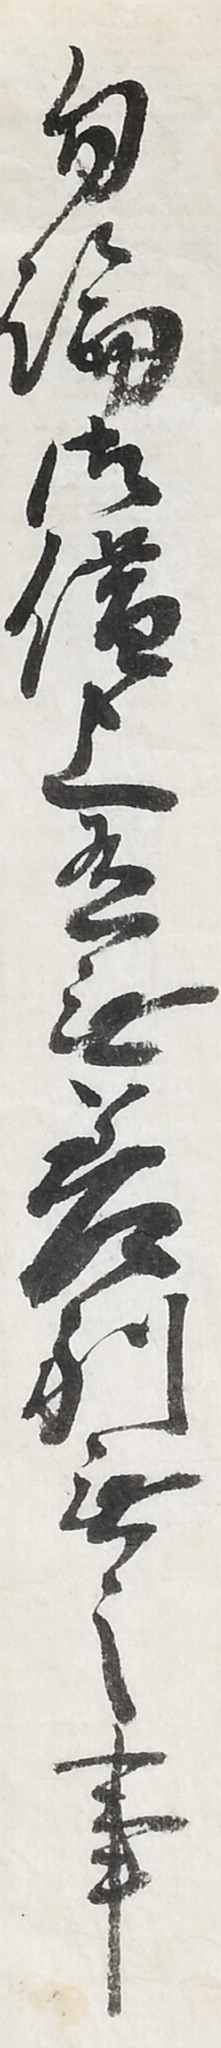勿論御借上有無差別無之事
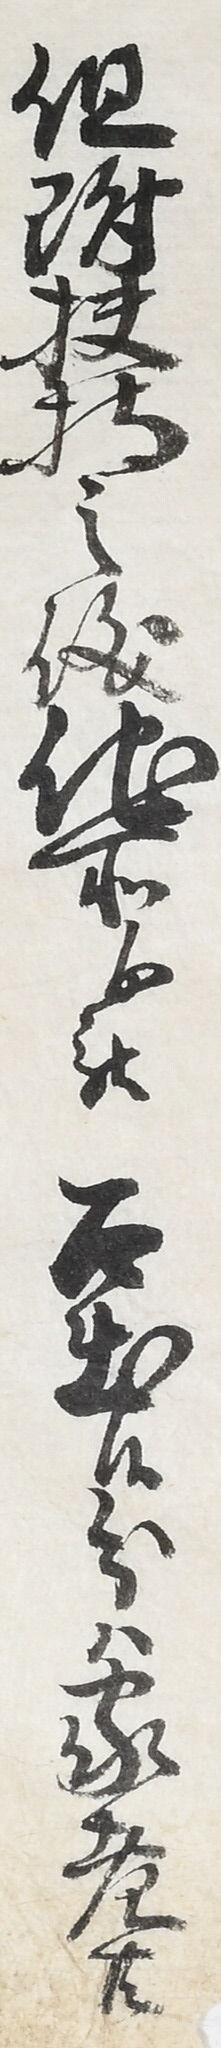但附扶持之儀他所ゟ被召出候分ハ家老共
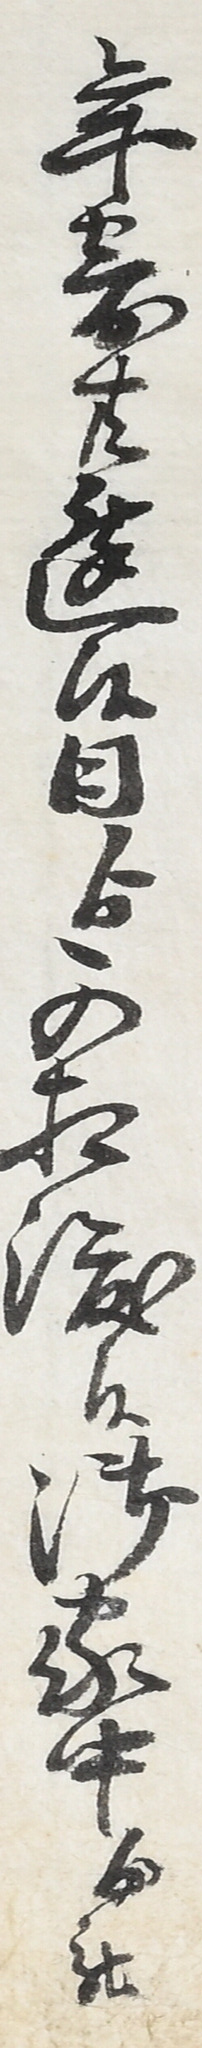年寄共逢候目ゟ可相渡候御家中ゟ被
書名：御給分渡方之定
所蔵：伊那市立高遠町図書館・合同会社AMANE
